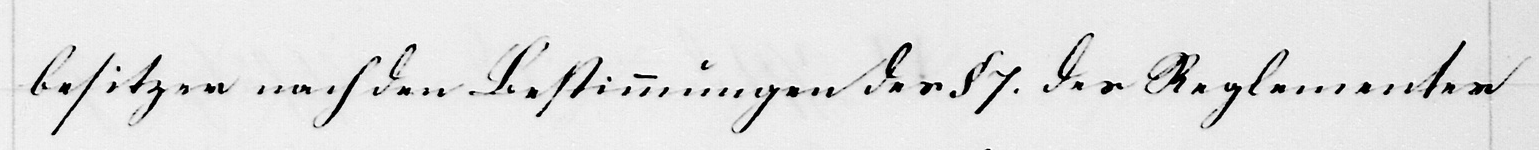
besitzer nach den Bestimmungen des § 7. des Reglementes
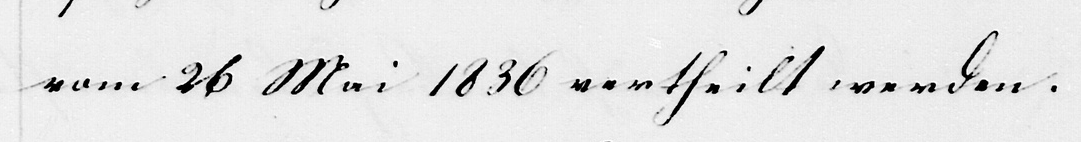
vom 26. Mai 1836 ertheilt werden.
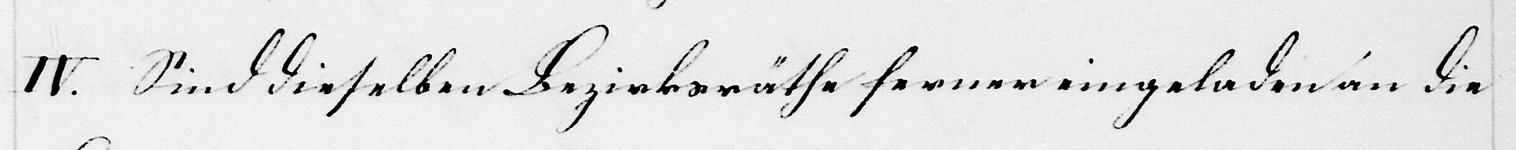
IV. Sind dieselben Bezirksräthe ferner eingeladen an die
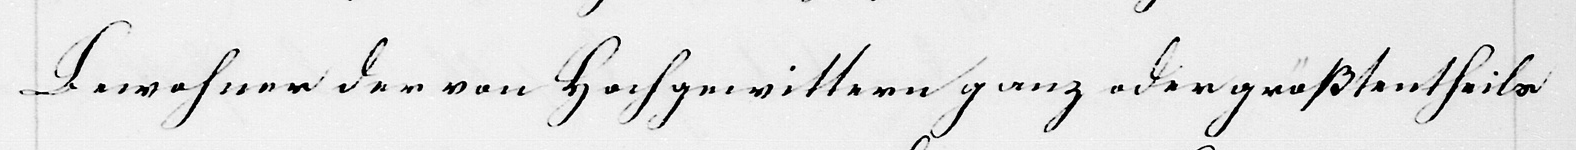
Bewohner der von Hochgewittern ganz oder größtentheils
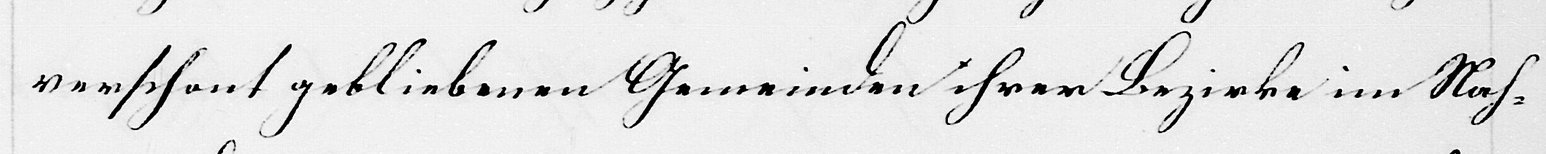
verschont gebliebenen Gemeinden ihrer Bezirke im Nah¬
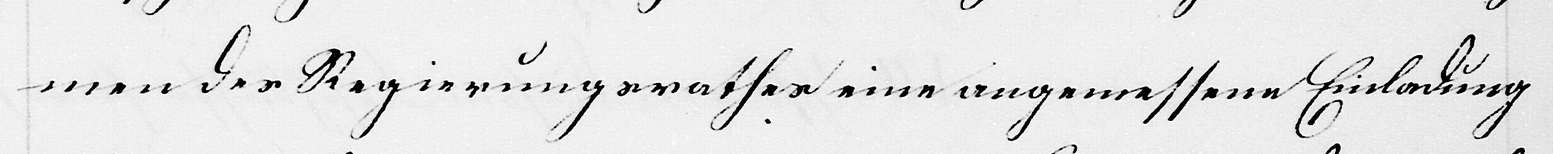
men des Regierungsrathes eine angemessene Einladung
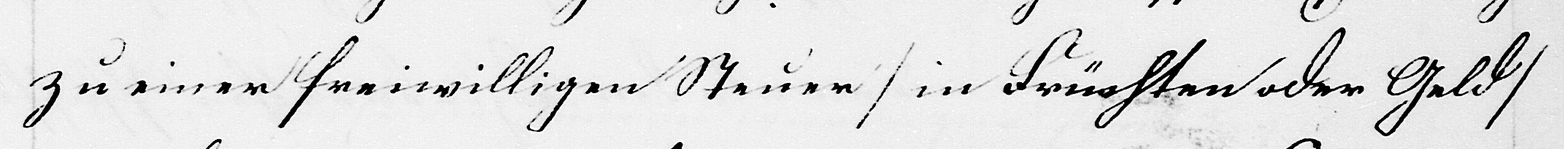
zu einer freiwilligen Steuer [in Früchten oder Geld]
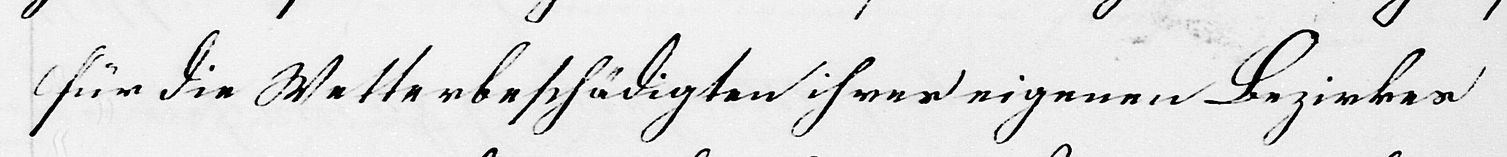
für die Wetterbeschädigten ihres eigenen Bezirkes
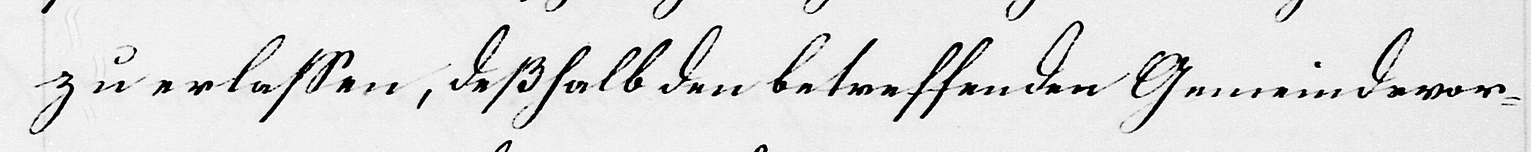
zu erlassen, deßhalb den betreffenden Gemeindsvor¬
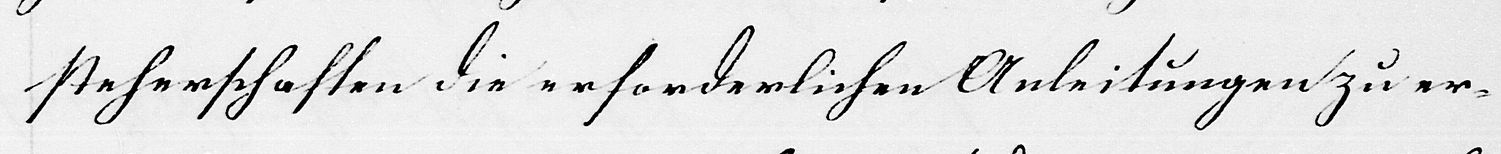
steherschaften die erforderlichen Anleitungen zu er¬
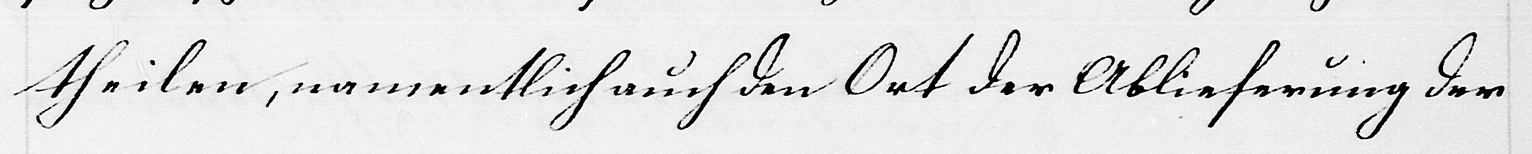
theilen, namentlich auf den Ort der Ablieferung der
